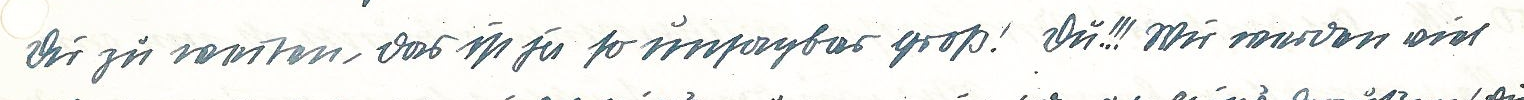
Dir zu weilen, das ist ja so unsagbar groß! Du!!! Wir werden viel
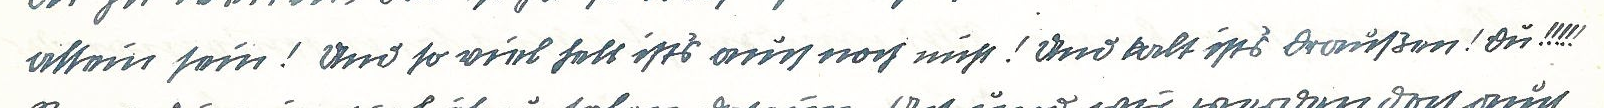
allein sein! Und so viel hell ist’s auch noch nicht! Und kalt ist’s draußen! Du!!!!!
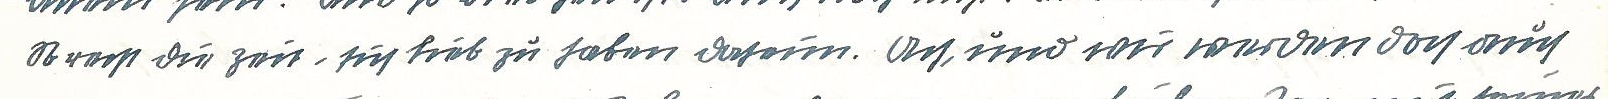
So recht die Zeit, sich lieb zu haben daheim. Ach, und wir werden doch auch
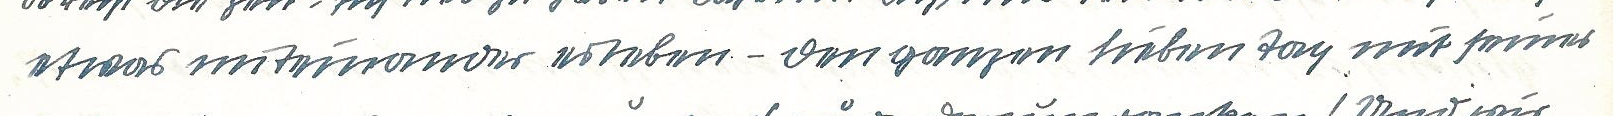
etwas miteinander erleben – den ganzen lieben Tag mit seiner
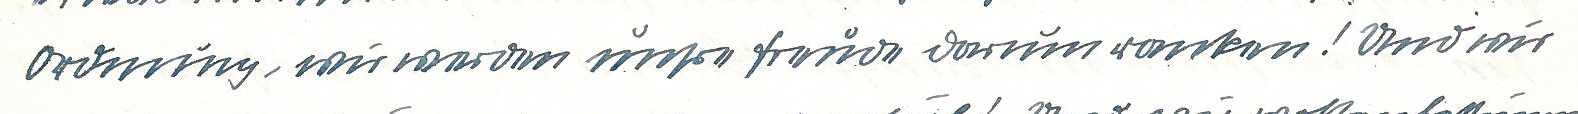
Ordnung, wir werden unsre Freude darum ranken! Und wir
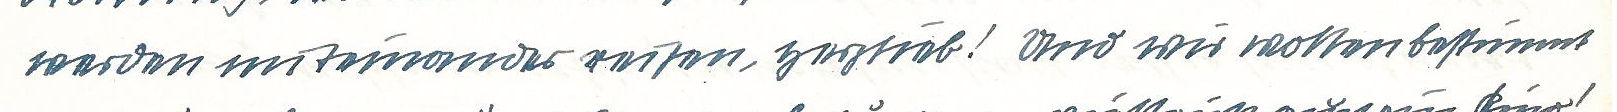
werden miteinander reisen, Herzlieb! Und wir wollen bestimmt
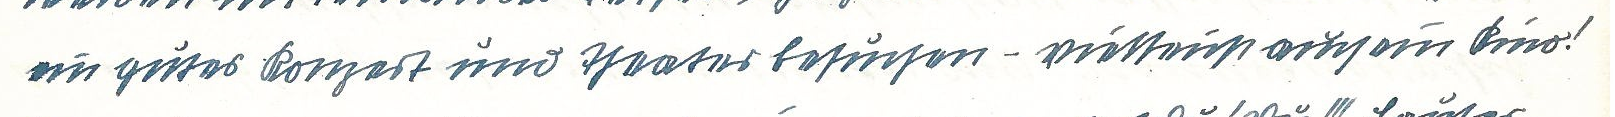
ein gutes Konzert und Theater besuchen – vielleicht auch ein Kino!
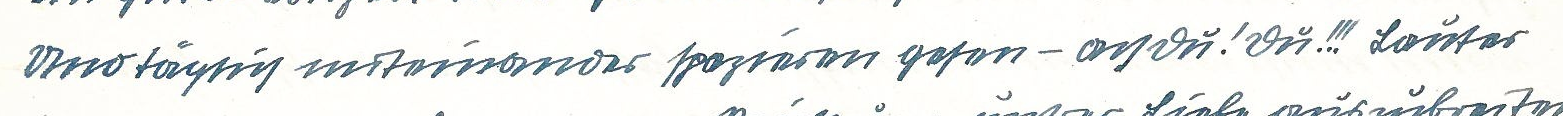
Und täglich miteinander spazieren gehen – ach Du! Du!!! Lauter
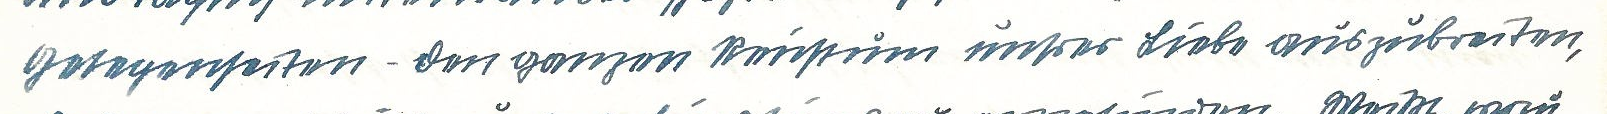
Gelegenheiten – den ganzen Reichtum unsrer Liebe auszubreiten,
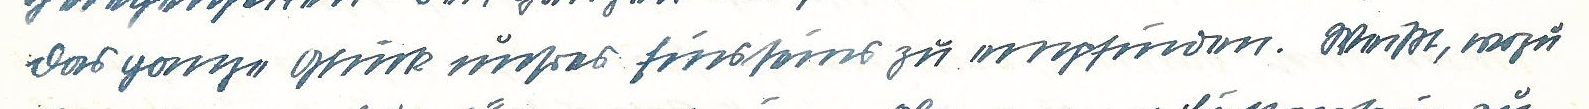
das ganze Glück unsres Einsseins zu empfinden. Weißt, wozu
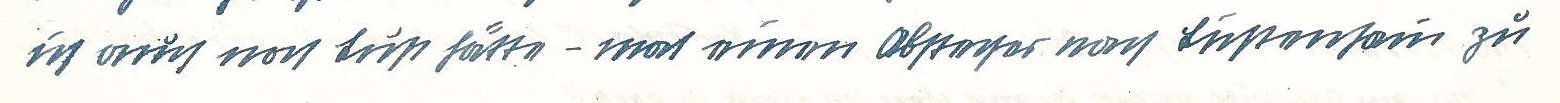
ich auch noch Lust hätte – mal einen Abstecher nach L. zu
